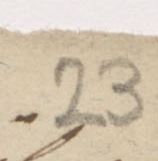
14.
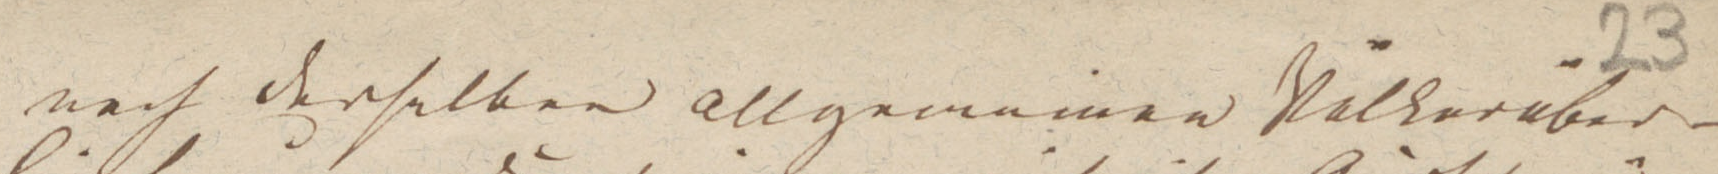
nach derselben allgemeinen Völkerüber-
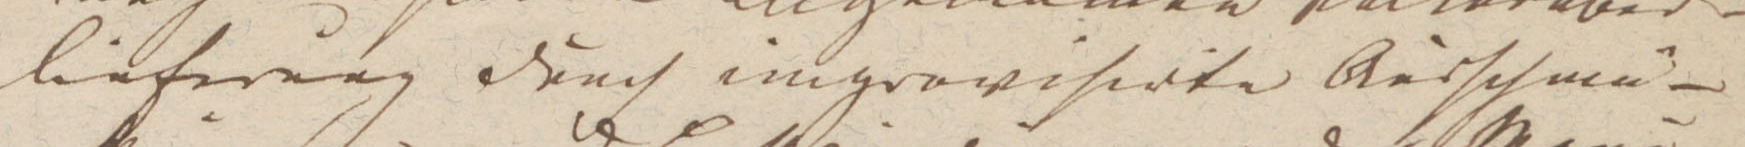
lieferung durch improvisirte Ausschmü-
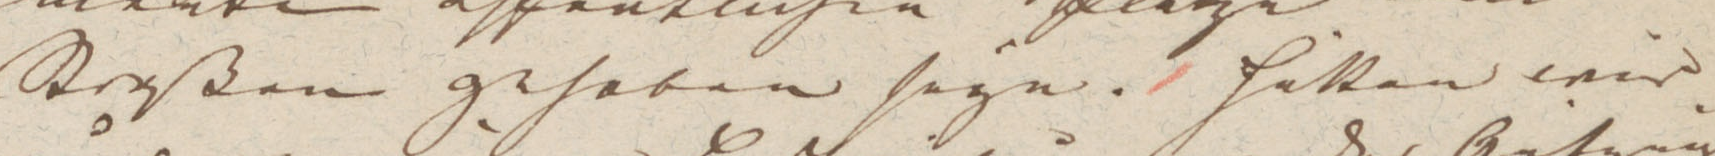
Strassen gehoben seyn. Hätten wir
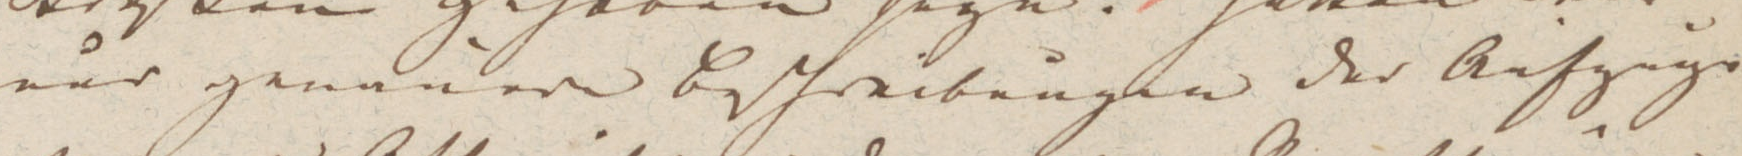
nur genauere Beschreibungen der Aufzüge
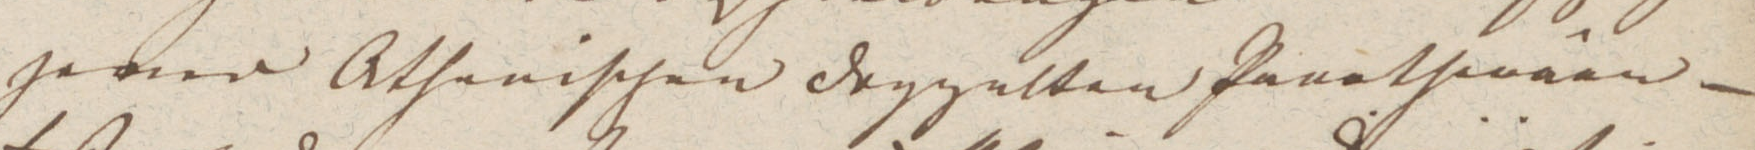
jener Athenischen doppelten Panathenäen-
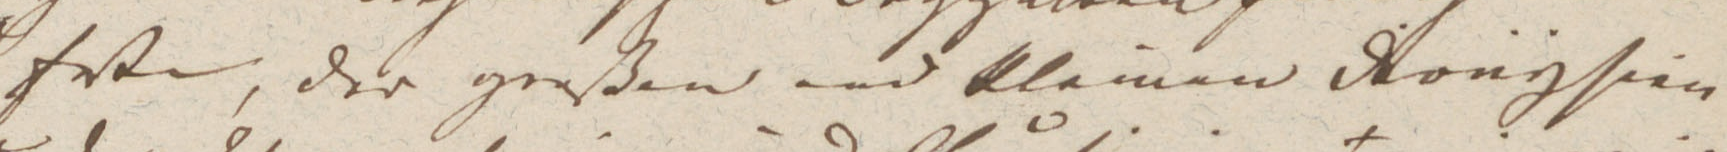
feste, der grossen und kleinen Dionysien
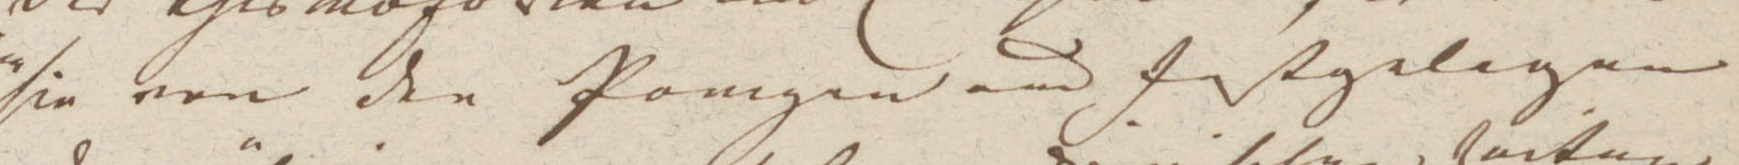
sie von den Pompen und Festgelagen
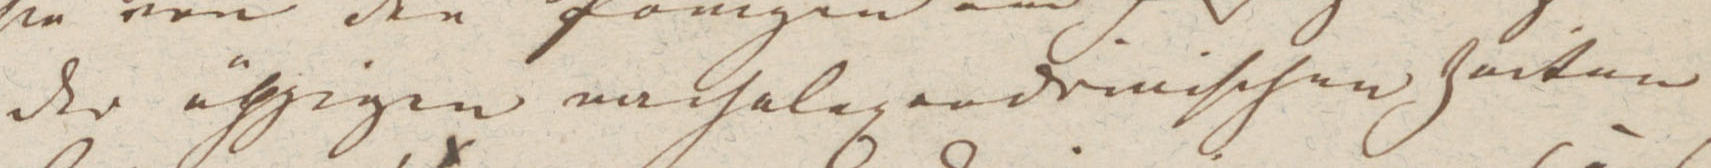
der üppigen nachalexandrinischen Zeiten
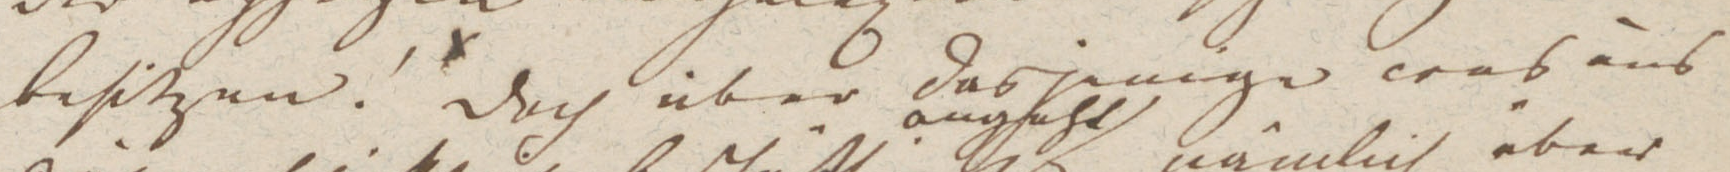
besitzen! % Doch über dasjenige was uns
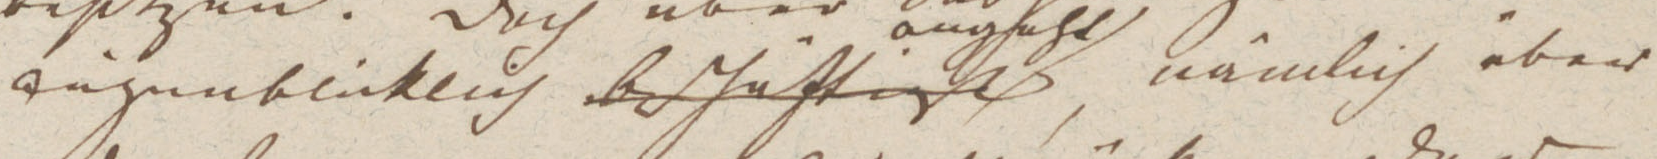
augenblicklich beschäftigt angeht, nämlich über
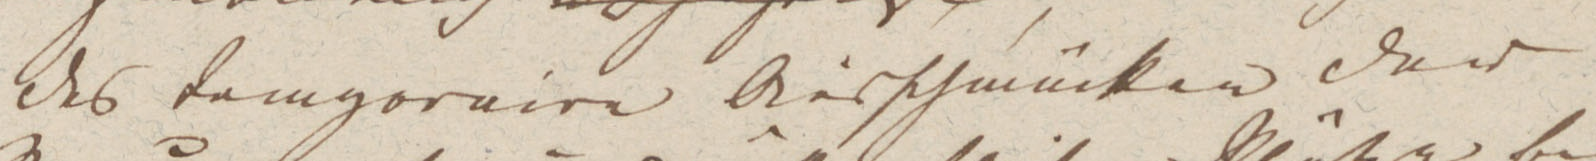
das temporaire Ausschmücken der
